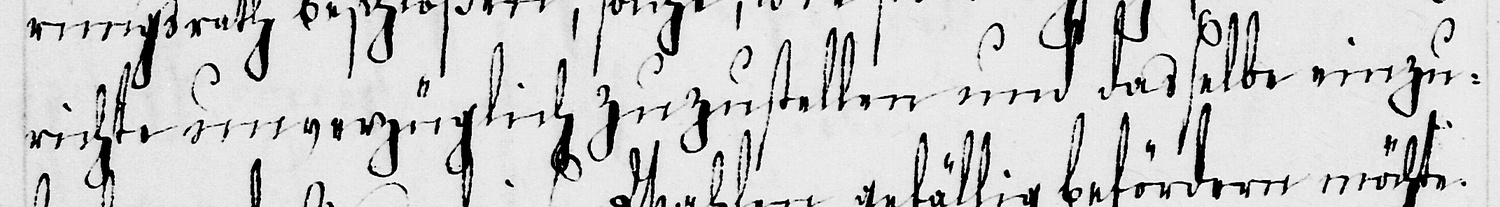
erichte unverzüglich zuzustellen und dasselbe einzu¬
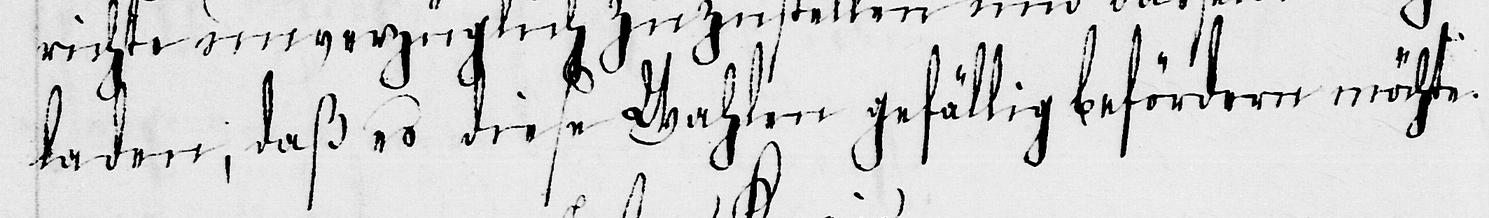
laden, daß es diese Wahlen gefällig befördern möchte.
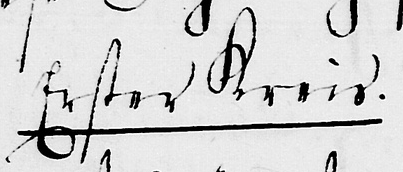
Erster Kreis.
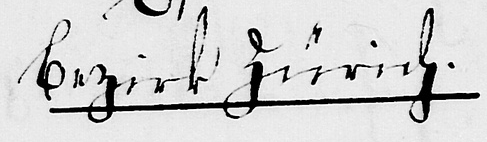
Bezirk Zürich.
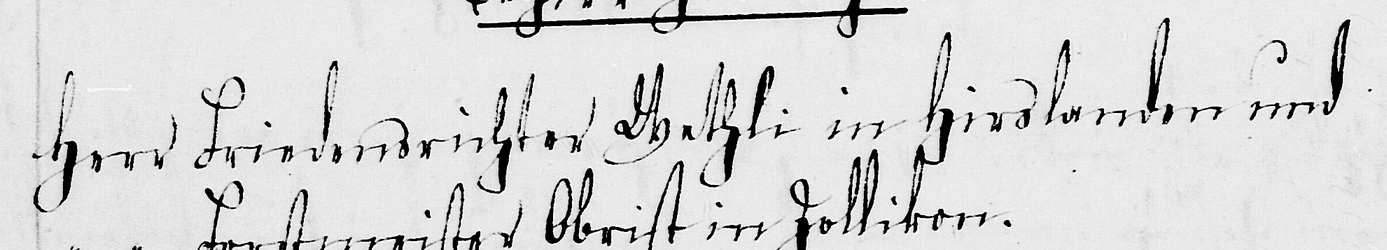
Herr Friedensrichter Wethli in Hirslanden und
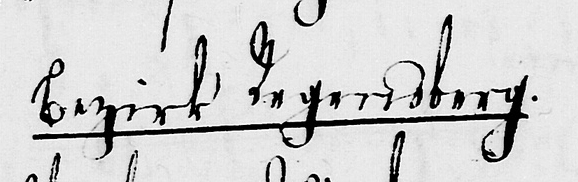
Bezirk Regensberg.
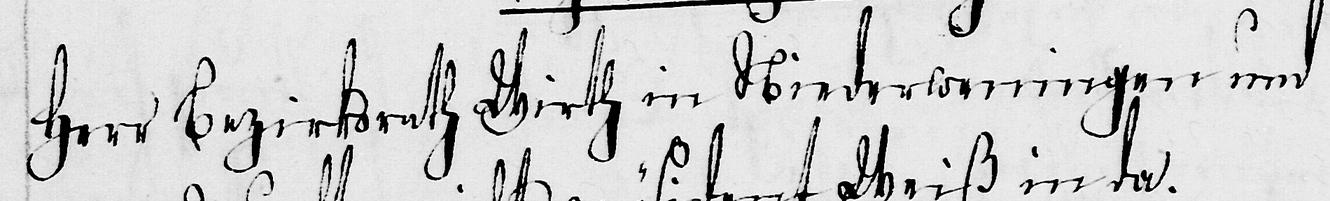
Herr Bezirksrath Wirth in Niederweningen und
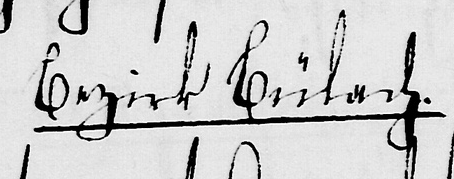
Bezirk Bülach.
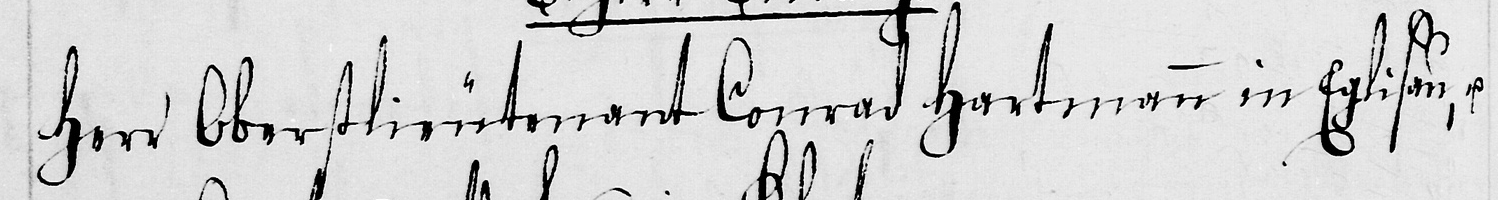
Herr Oberstlieutenant Conrad Hartmann in Eglisau,
